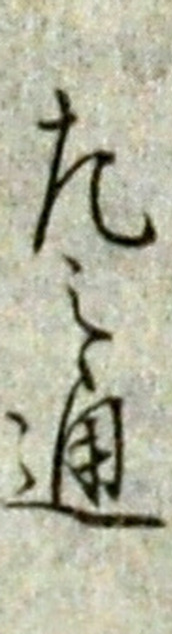左之通
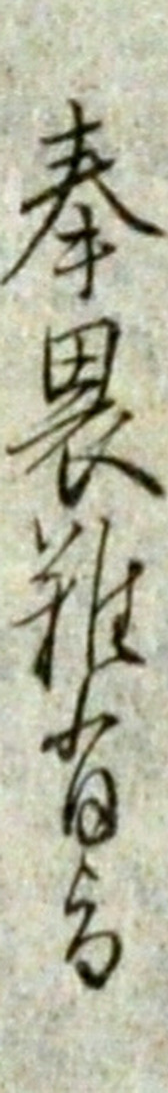奉畏難有旨
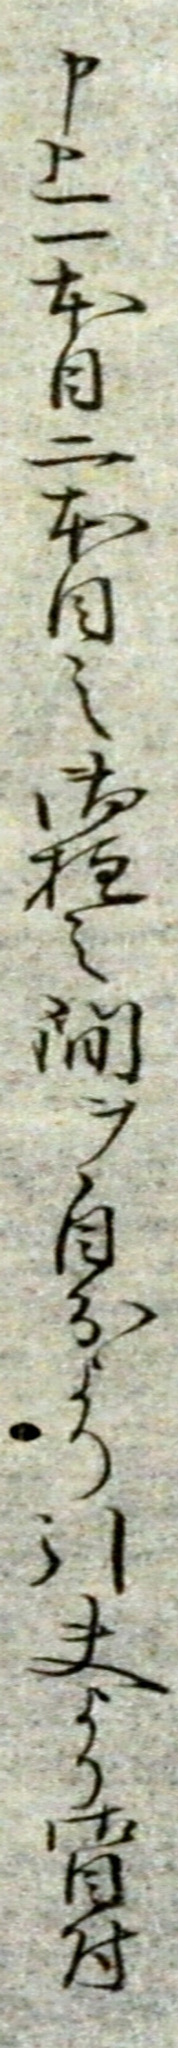申上一本目二本目之御柱之間ヲ自分より引夫より御目付
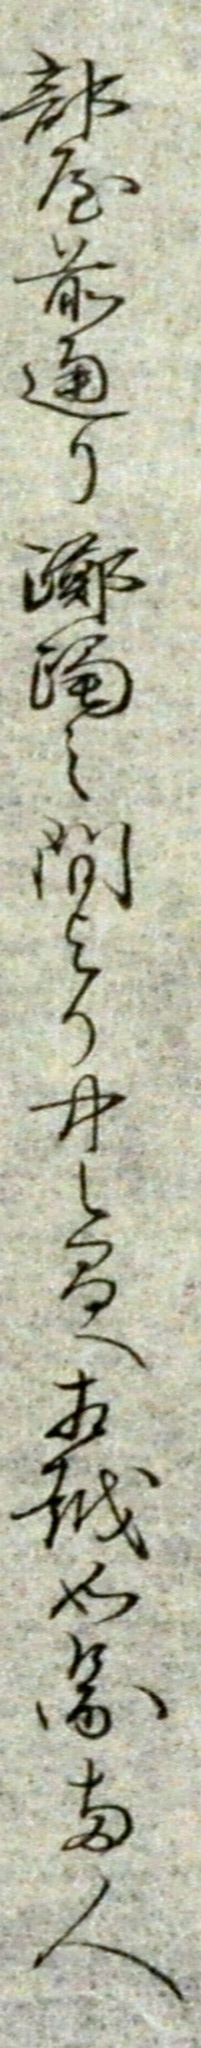部屋前通り躑躅之間より中之間へ相越如図両人
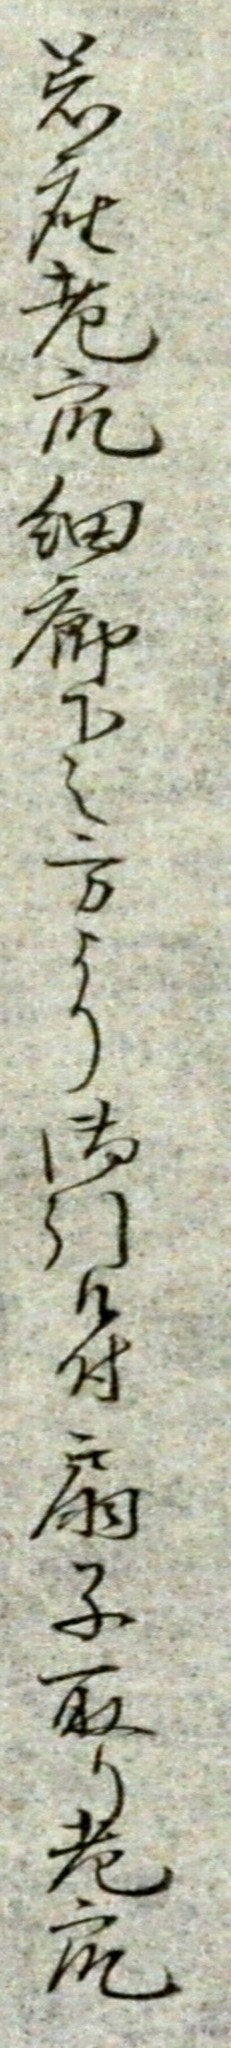着座老衆細廊下之方より御引候付扇子取り老衆
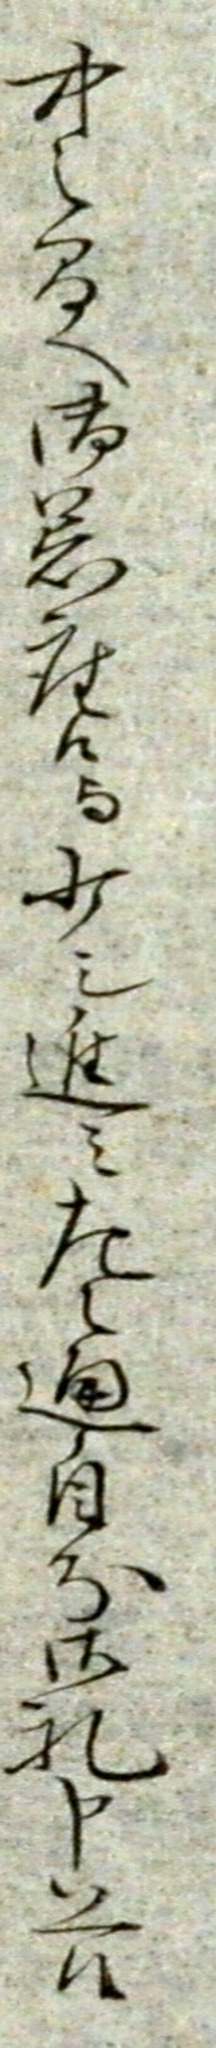中之間へ御着座候と少し進ミ左之通自分御礼申上候
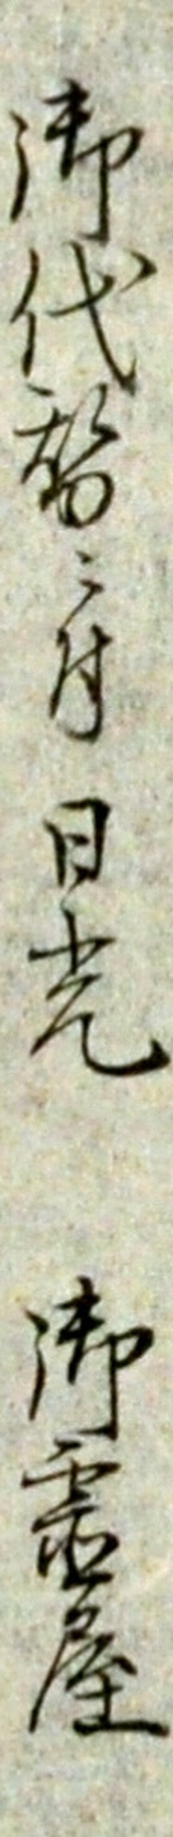御代替ニ付日光御霊屋
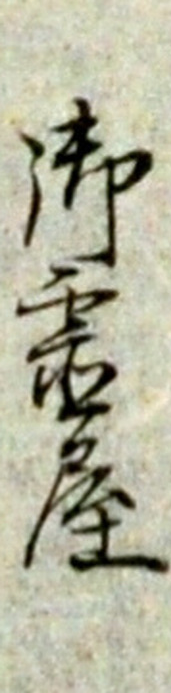御霊屋
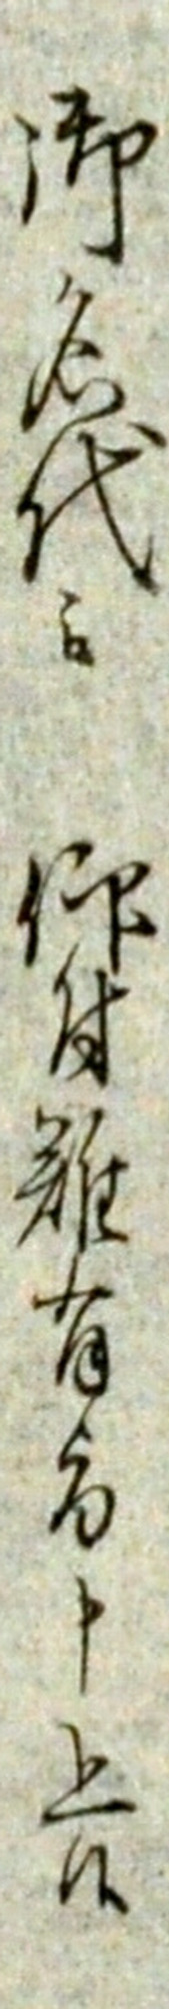御名代被仰付難有旨申上候
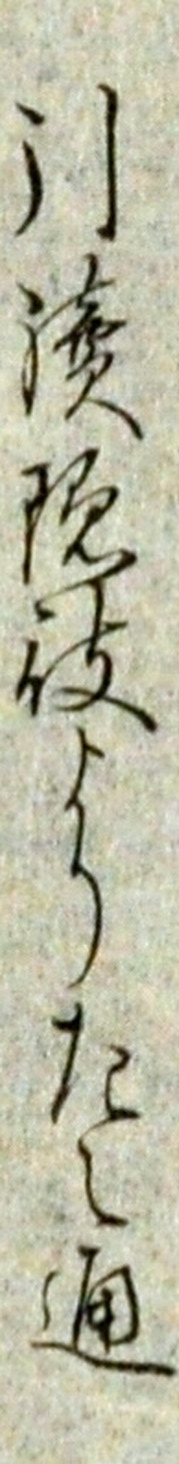引続隠岐より左之通
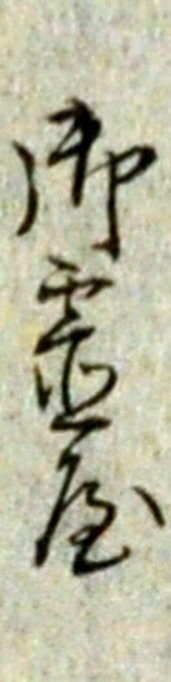御霊屋
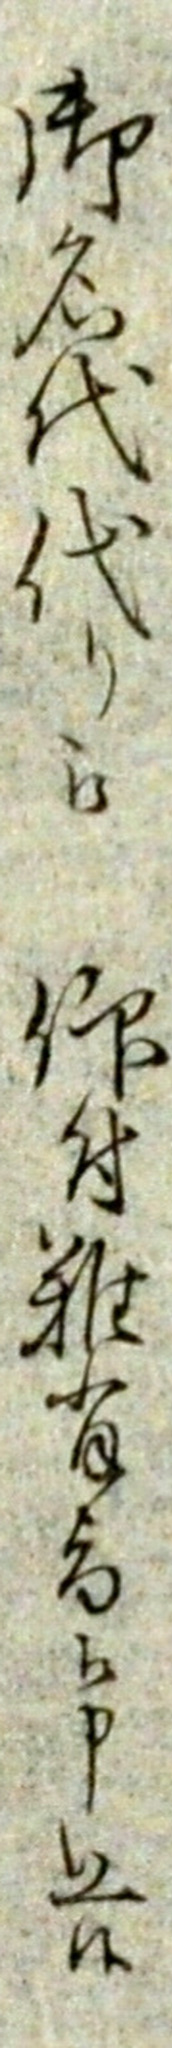御名代り被仰付難有旨被申上候
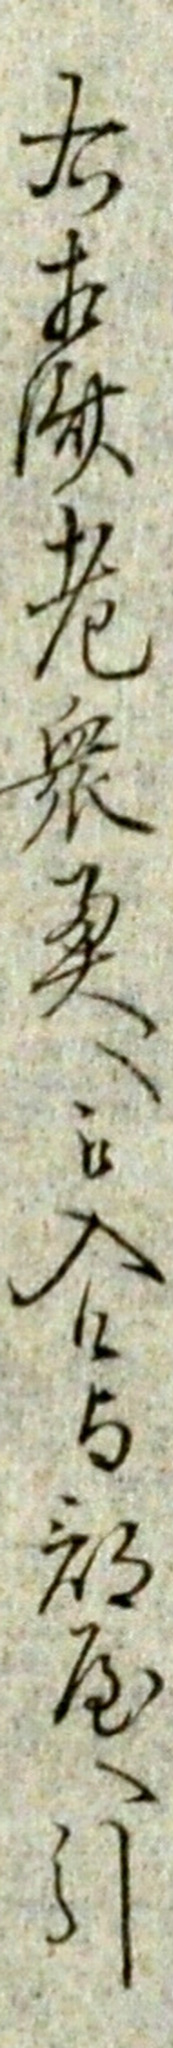右相済老衆奥へ被入候と部屋へ引
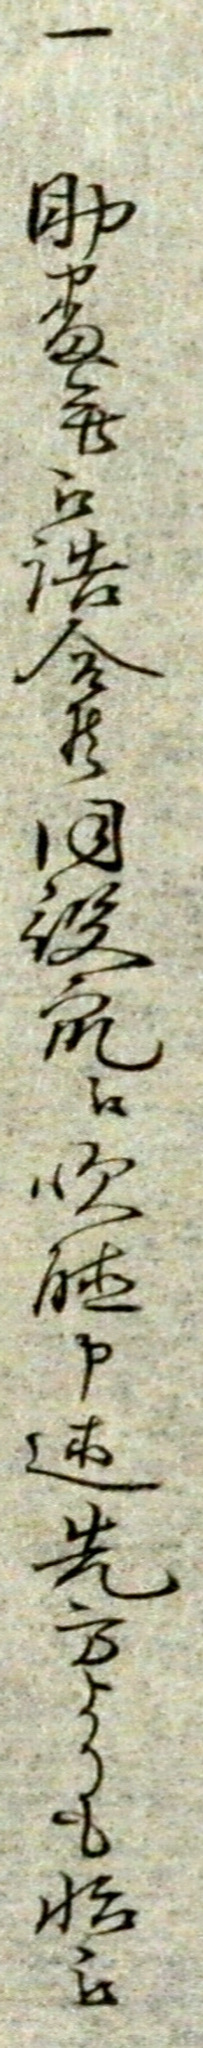一助番幷被詰合共同役衆江吹聴申述先方よりも怡被
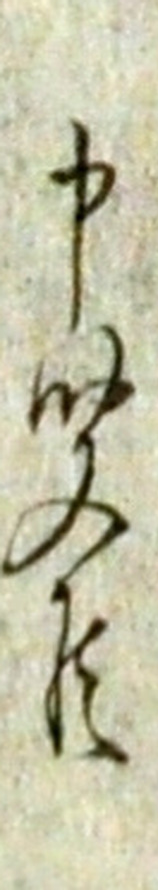申聞候
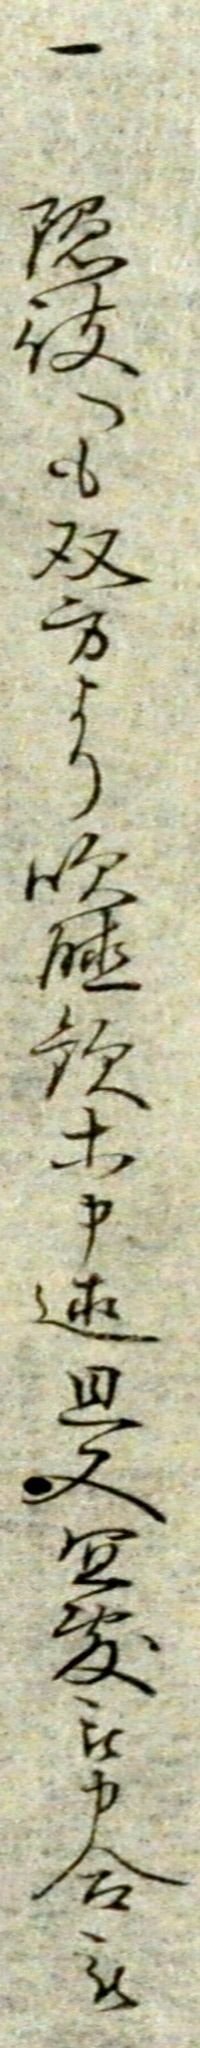一隠岐へも双方より吹聴歓等申述且又宜敷被申合被
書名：日光御名代相勤候節ノ留
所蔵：伊那市立高遠町図書館・合同会社AMANE
